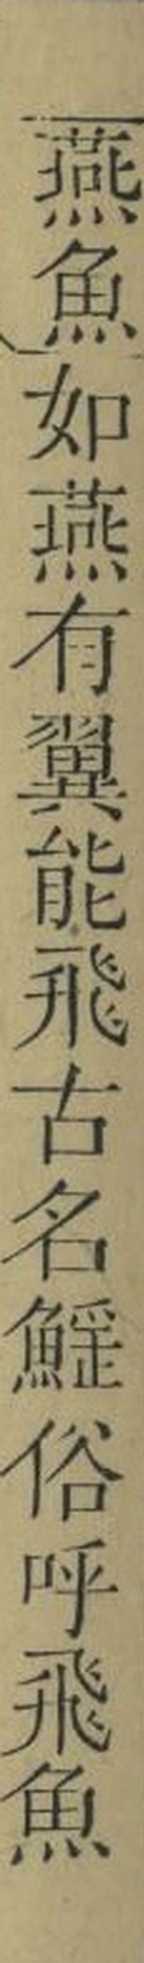[燕魚]如燕有翼能飛古名鳐俗呼飛魚
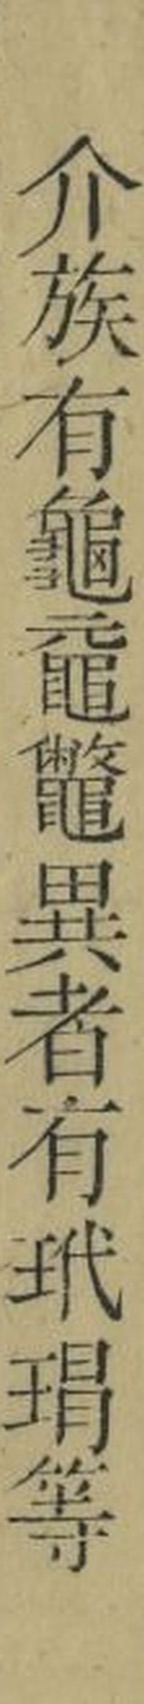介族有亀黿鼈異者有玳瑁等
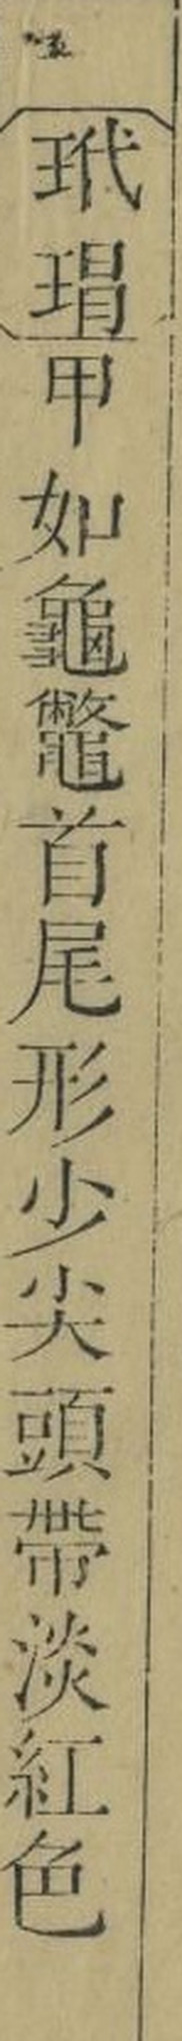[玳瑁]甲如亀鼈首尾形少尖頭帯淡紅色
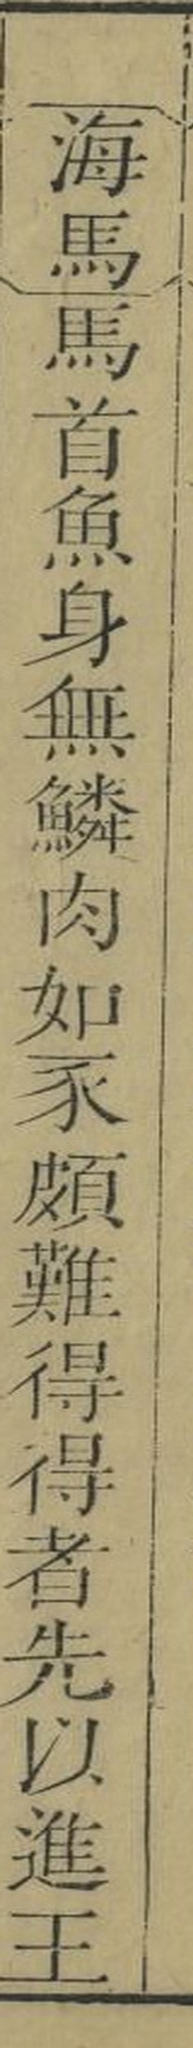[海馬]馬首魚身無鱗肉如豕頗難得得者先以進王
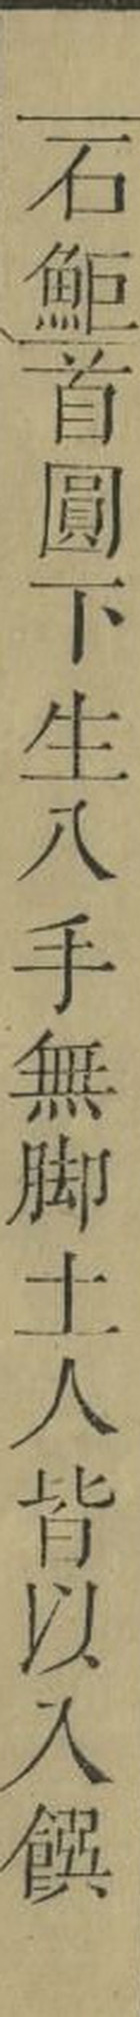[石鮔]首円下生八手無脚土人皆以入饌
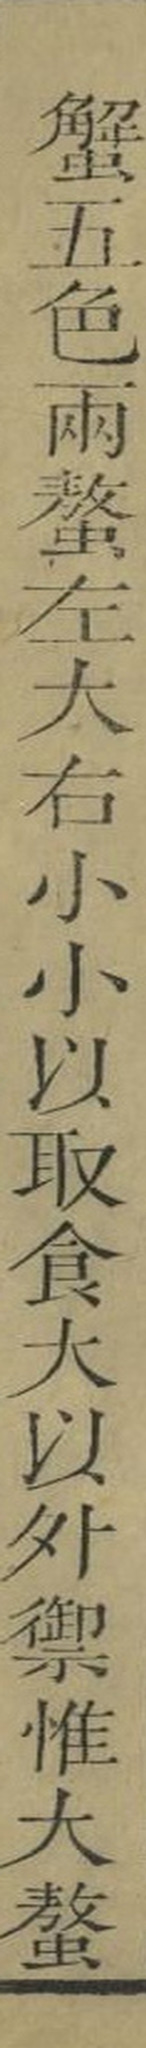蟹五色両螯左大右小小以取食大以外禦惟大螯
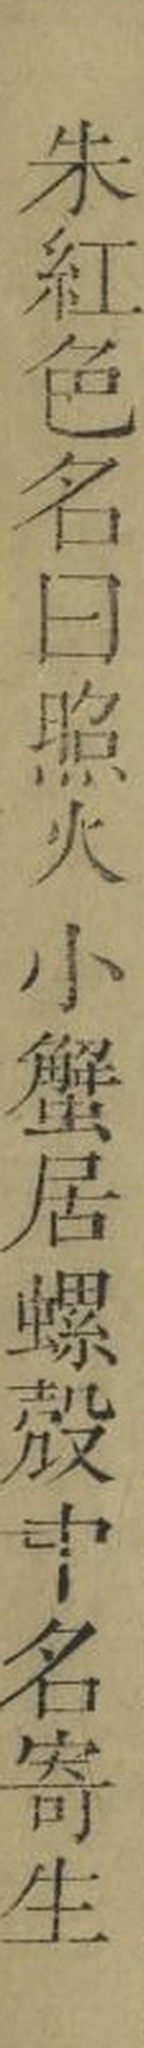朱紅色名曰照火小蟹居螺殻中名寄生

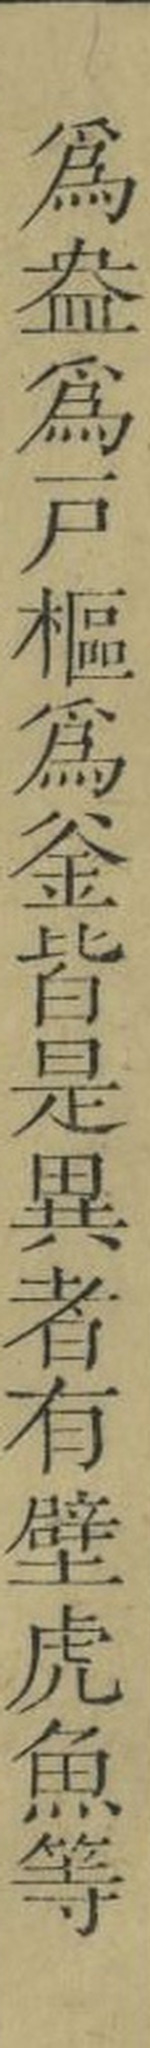為盎為戸枢為釜皆是異者有壁虎魚等
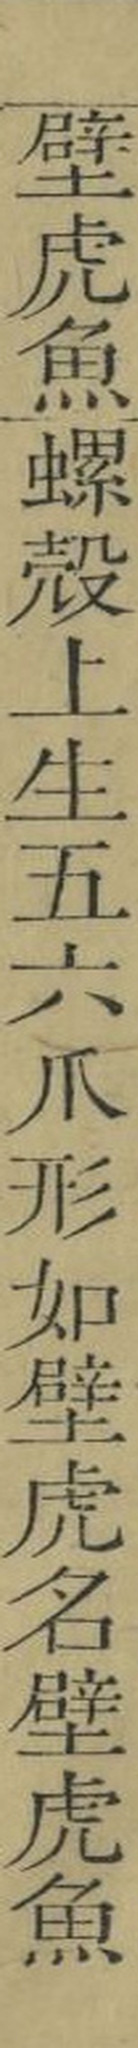[壁虎魚]螺殻上生五六爪形如壁虎名壁虎魚
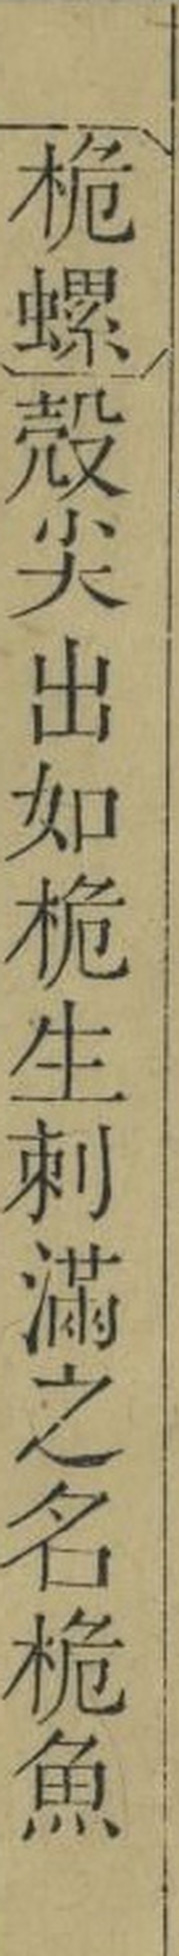[桅螺]殻尖出如桅生刺満之名桅魚
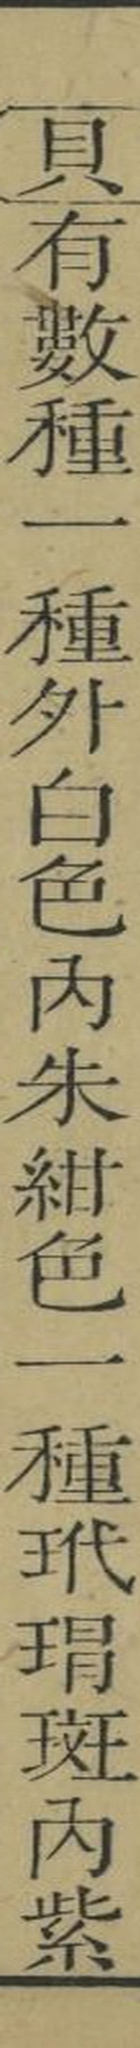[貝]有数種一種外白色内朱紺色一種玳瑁斑内紫
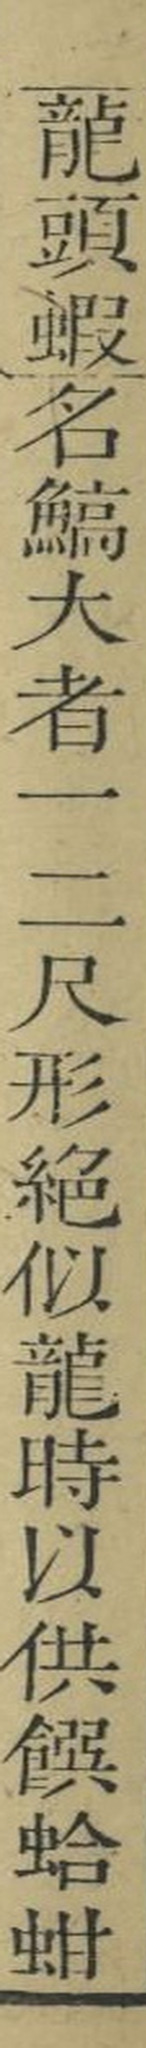[竜頭蝦]名鰝大者一二尺形絶似竜時以供饌蛤蚶
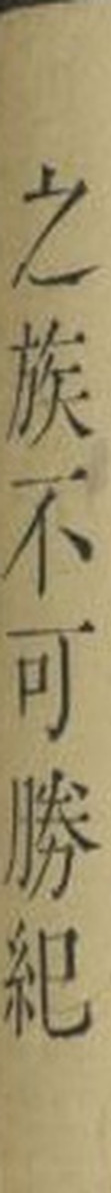之族不可勝紀
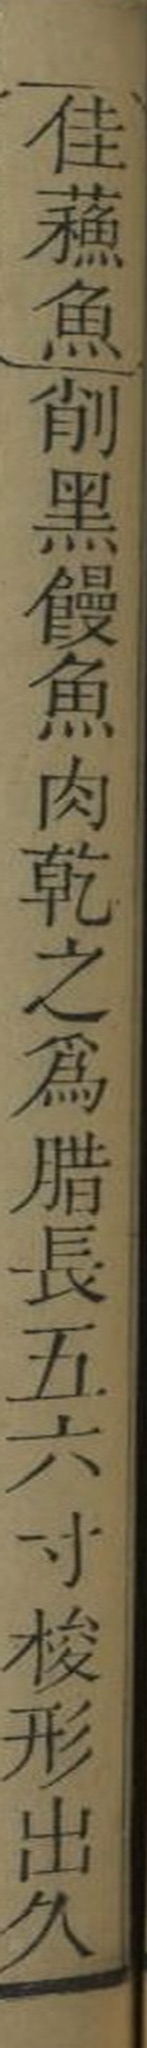[佳蘇魚]削黒饅魚肉乾之為腊長五六寸梭形出久
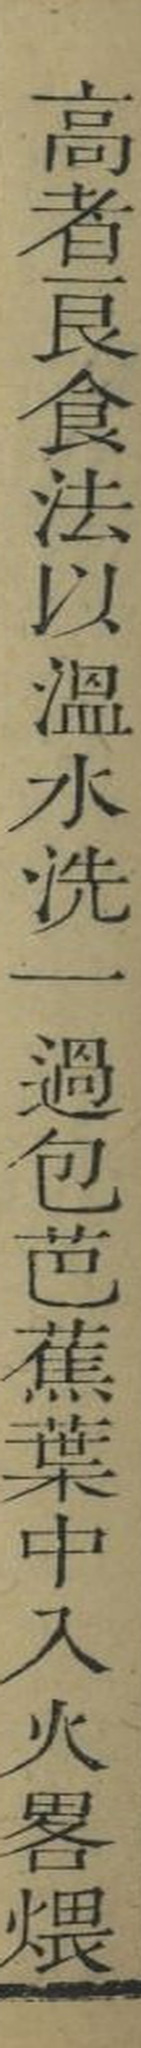高者良食法以温水洗一過包芭蕉葉中入火略煨
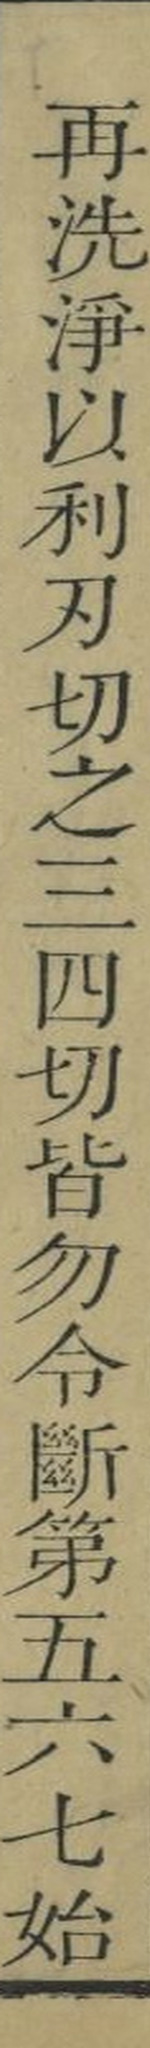再洗浄以利刃切之三四切皆勿令断第五六七始
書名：中山伝信録 巻六
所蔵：University of the Ryukyus Library
